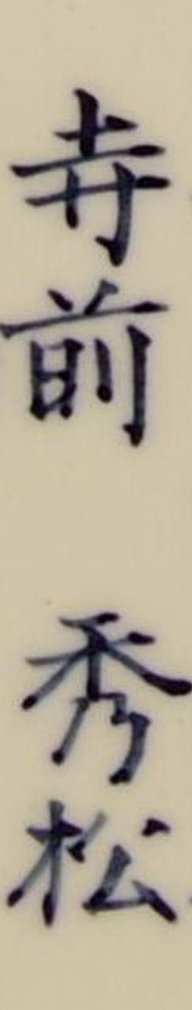寺前秀松
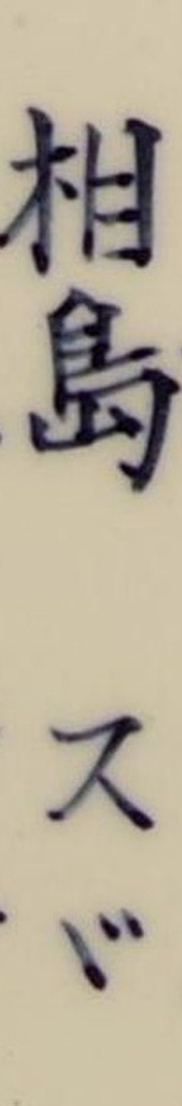相島スゞ
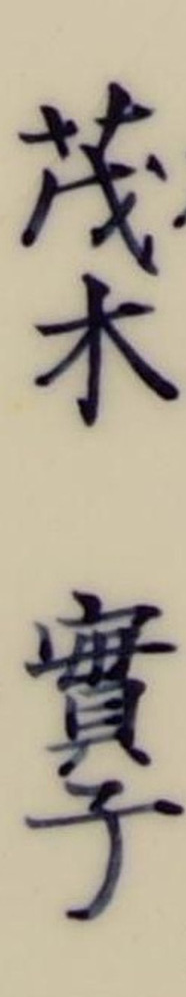茂木寶子
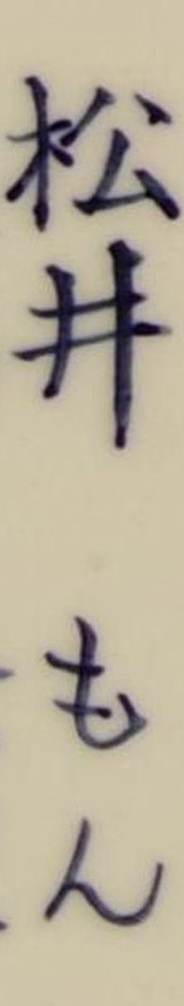松井もん
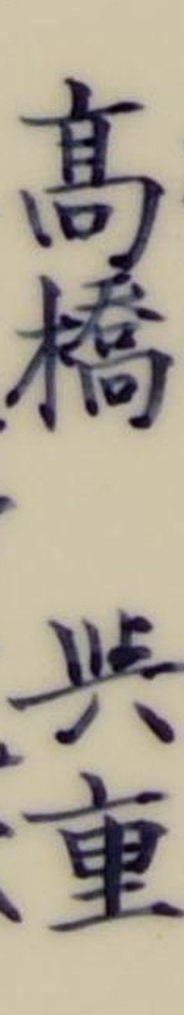高橋興重
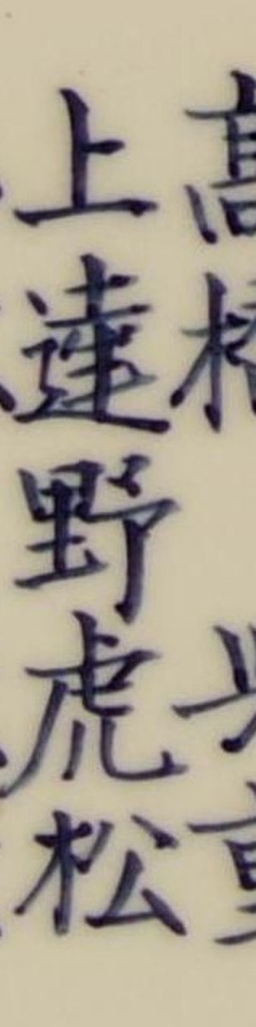上達野虎松
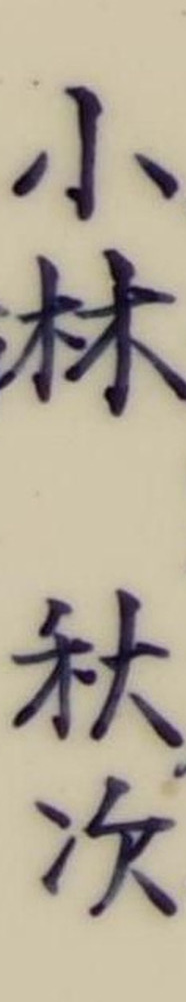小林秋次
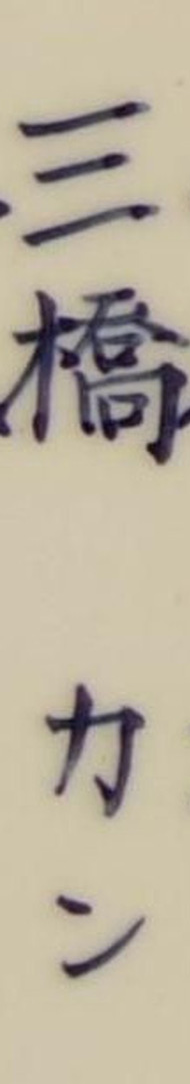三橋カン
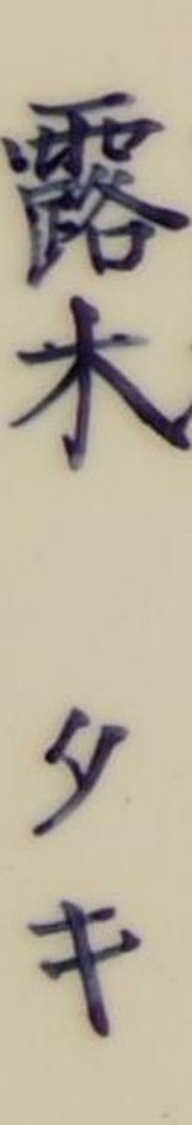露木タキ
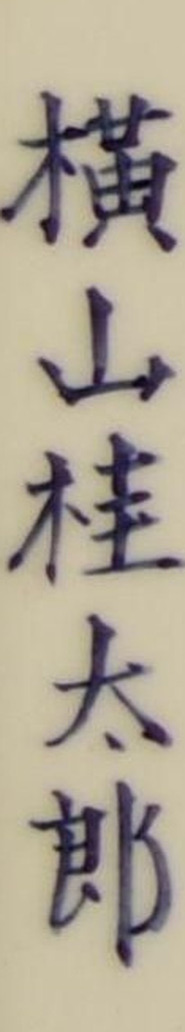横山桂太郎

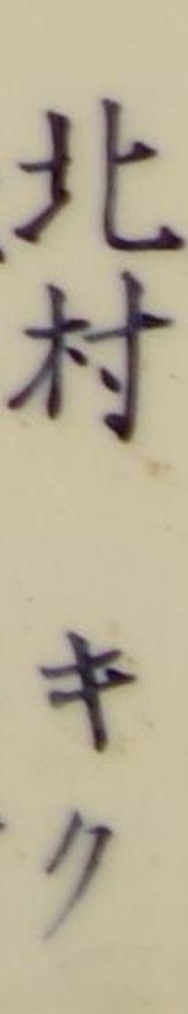北村キク
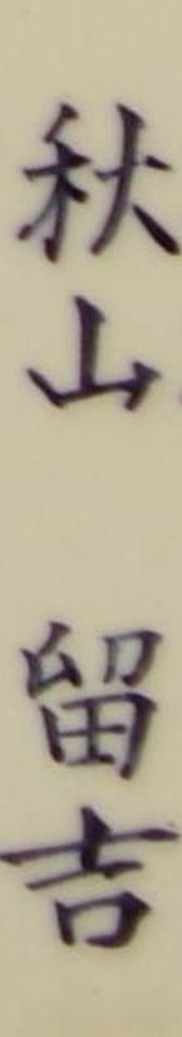秋山留吉
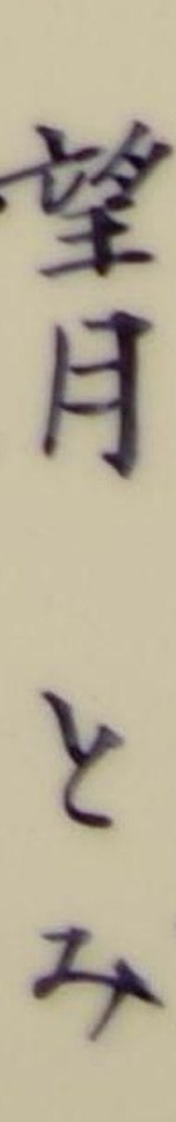望月とみ
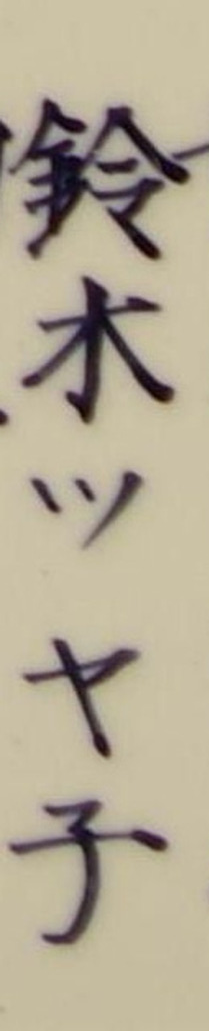鈴木ツヤ子
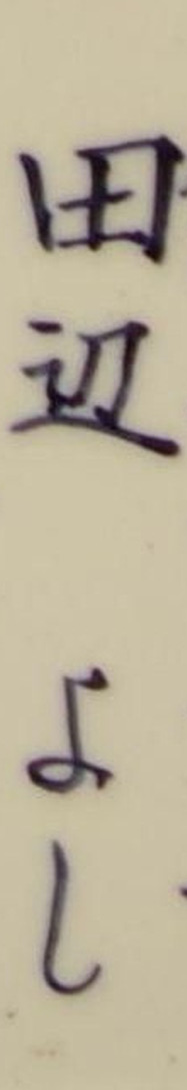田辺よし
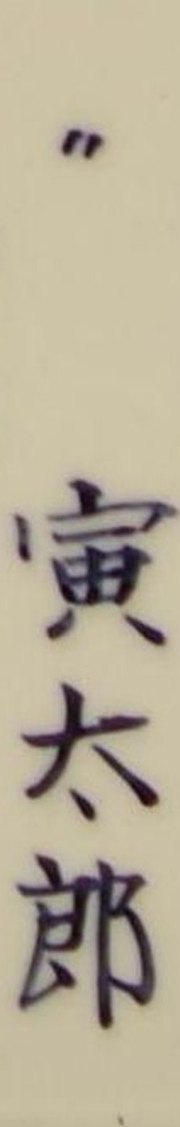寅太郎
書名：E~L
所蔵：高野山金剛峯寺
